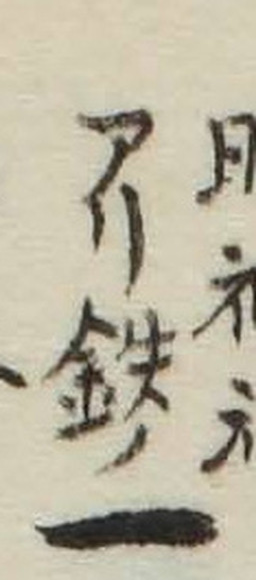アリ鉄ノ
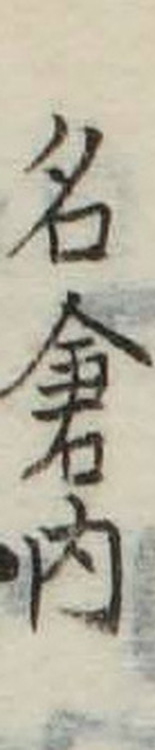名倉内
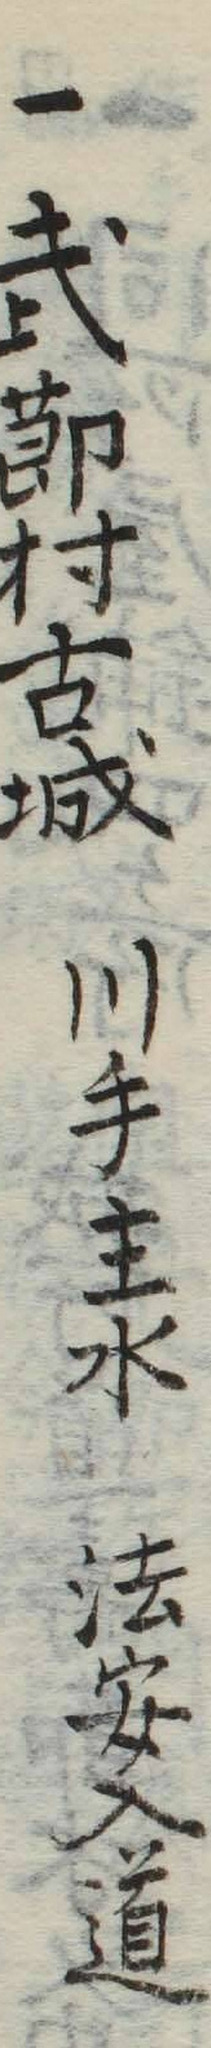一武節村古城川手主水法安入道

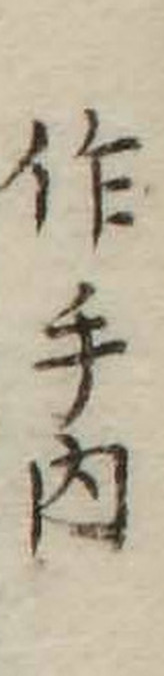作手内
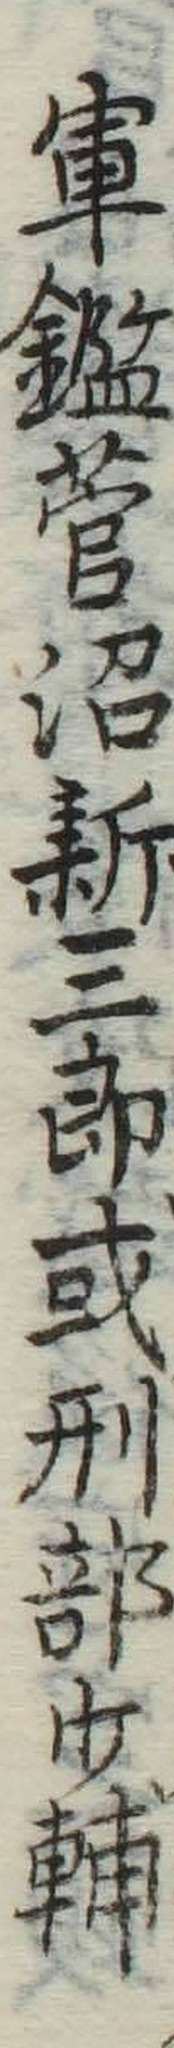軍鑑菅沼新三郎或刑部少輔
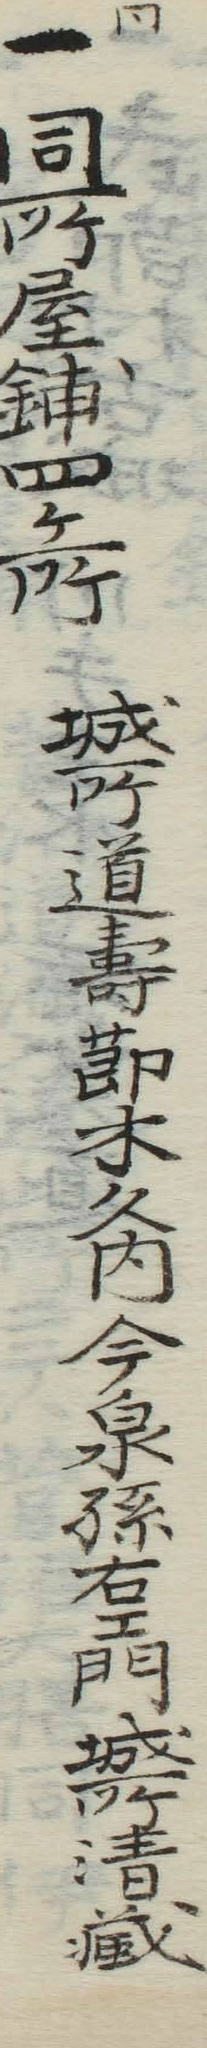一同所屋鋪四ヶ所城所道壽節木久内今泉孫右エ門城所清蔵
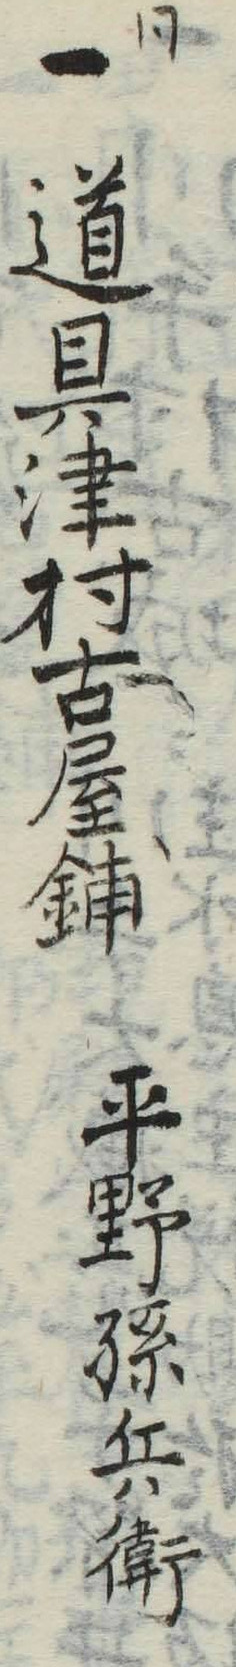一道具津村古屋鋪平野孫兵衛
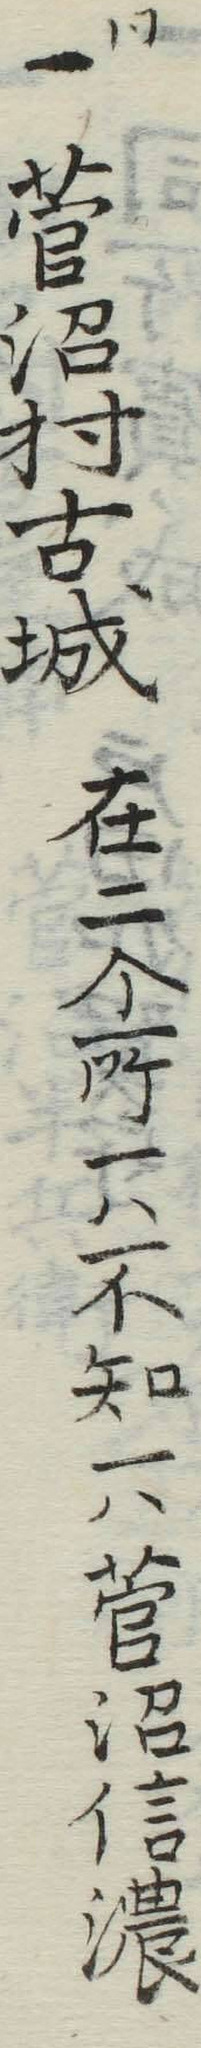一菅沼村古城在二箇所一ハ不知一ハ菅沼信濃
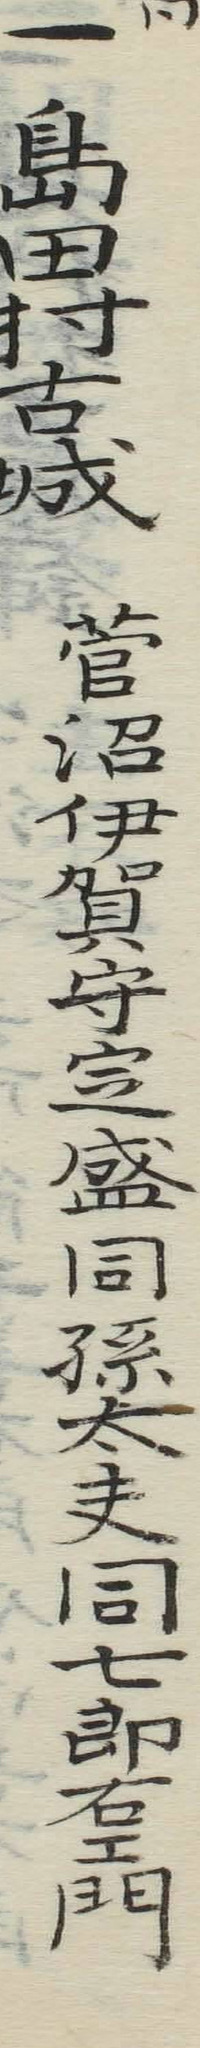一島田村古城菅沼伊賀守定盛同孫太夫同七郎右エ門
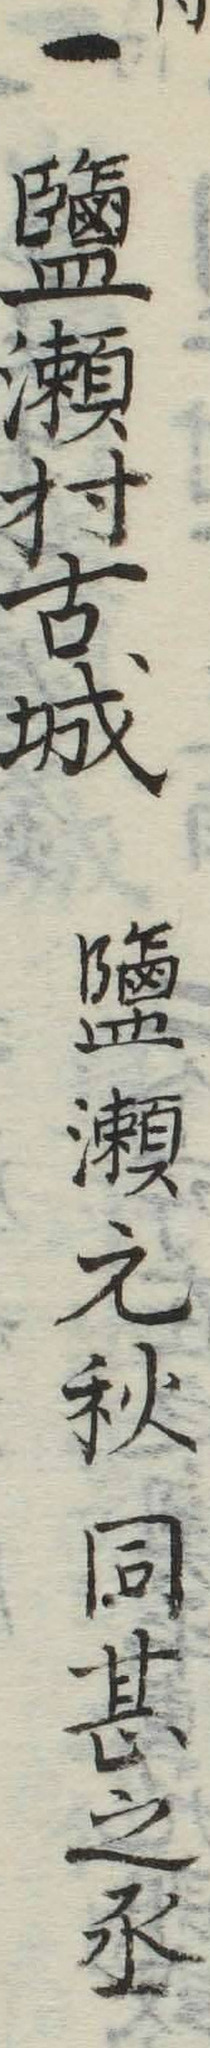一塩瀬村古城塩瀬元秋同甚之丞
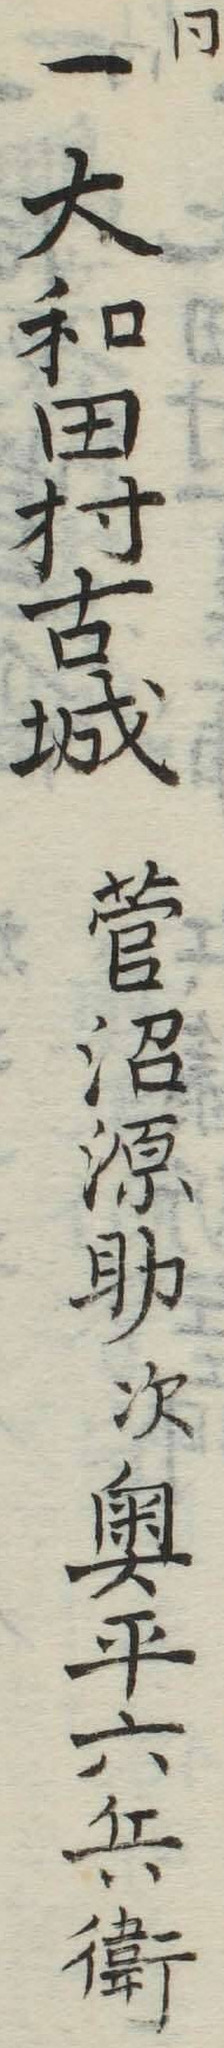一大和田村古城菅沼源助次奥平六兵衛
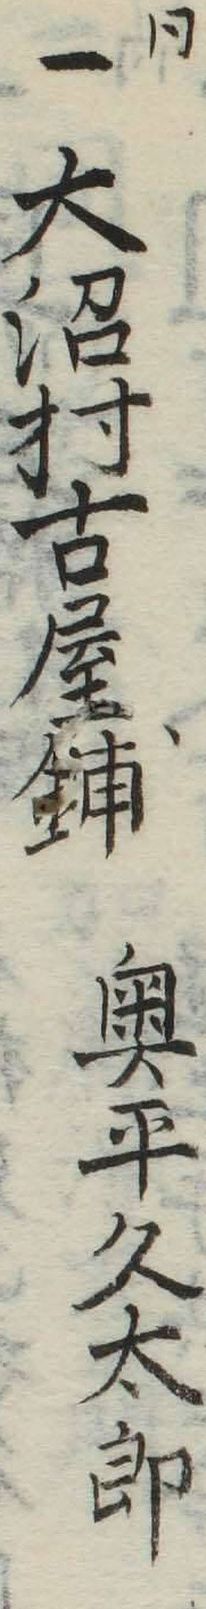一大沼村古屋鋪奥平久太郎
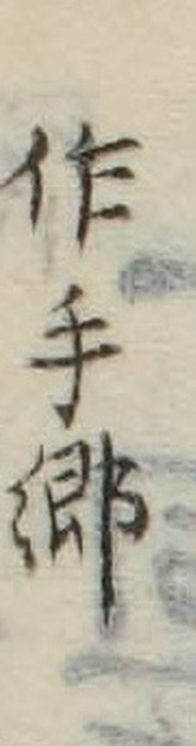作手郷
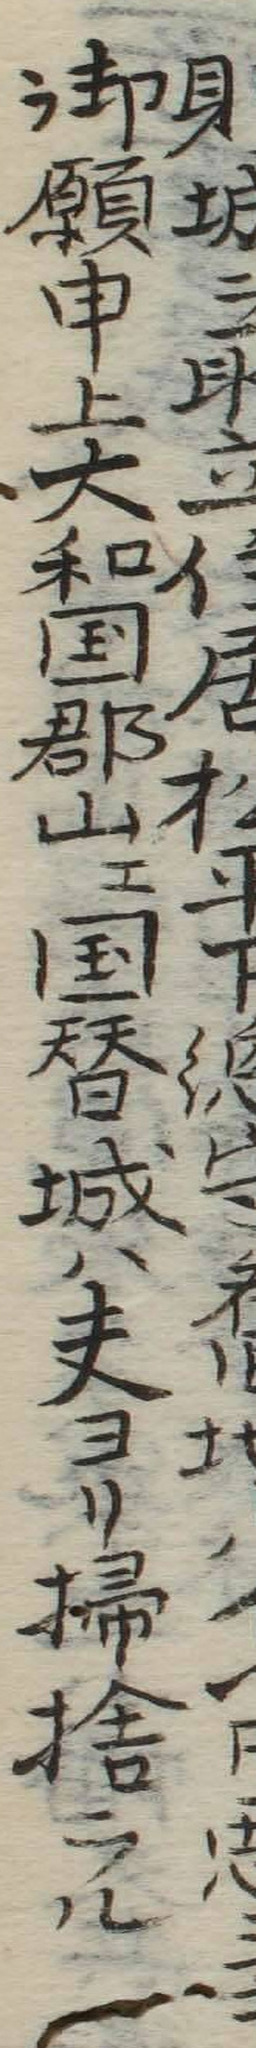御願申上大和国郡山エ国替城ハ夫ヨリ掃捨ラル

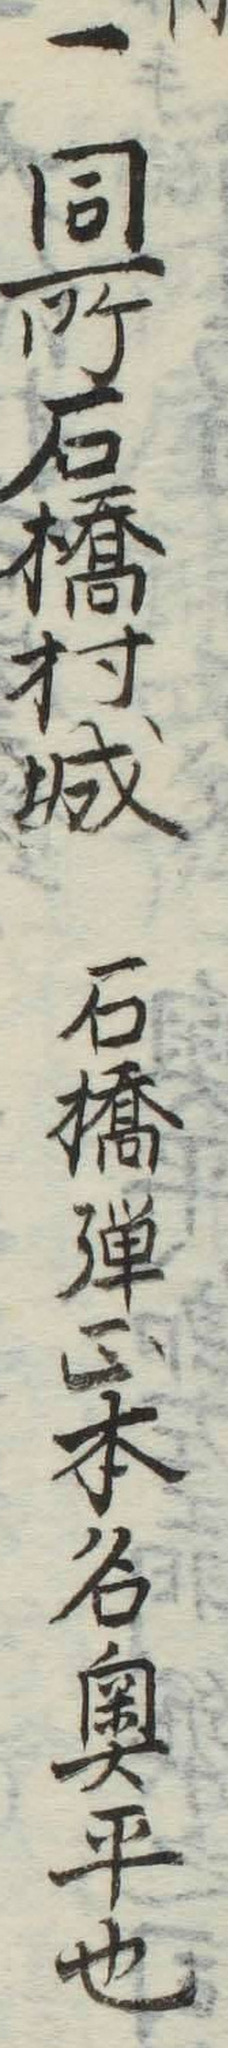一同所石橋村城石橋禅正本名奥平也
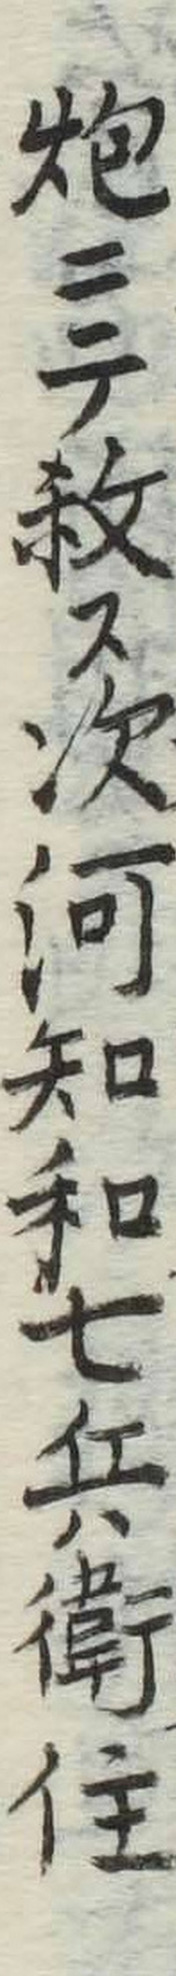炮ニテ殺ス次河知和七兵衛住
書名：三河国二葉松
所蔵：国文学研究資料館
